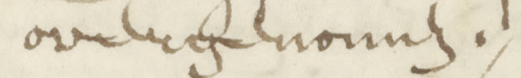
overgenomen.
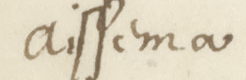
Aissema
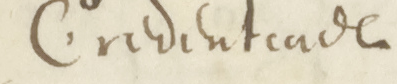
Credentiael
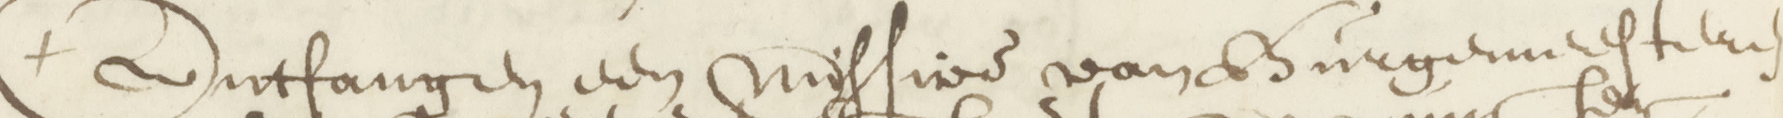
Ontfangen een Missive van Burgemeesteren
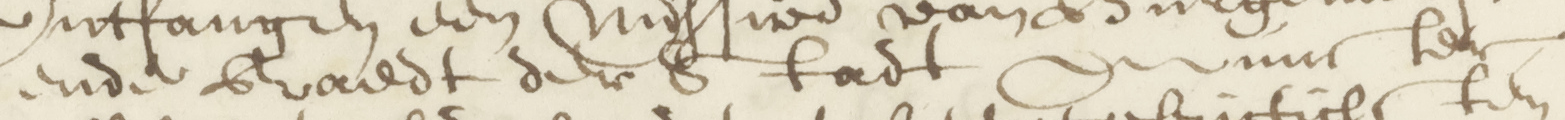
ende Raedt der Stadt Munster
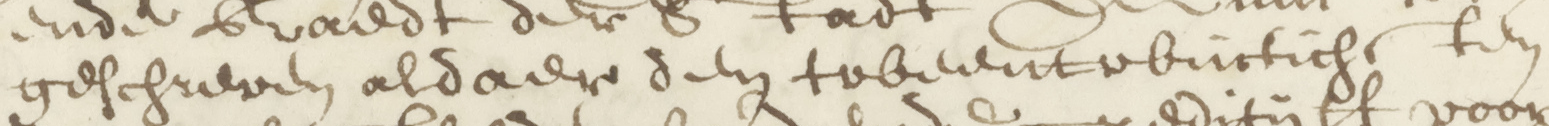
geschreven aldaer den tweentwintichsten
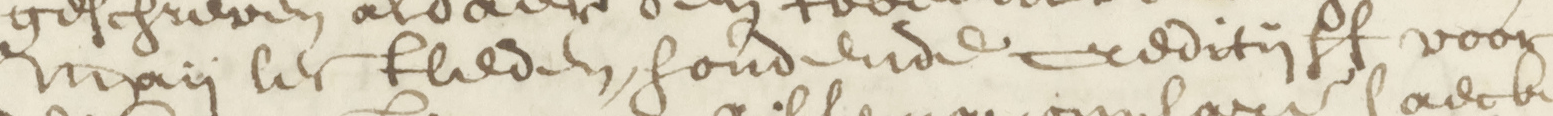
Maij lestleden, houdende creditijff voor
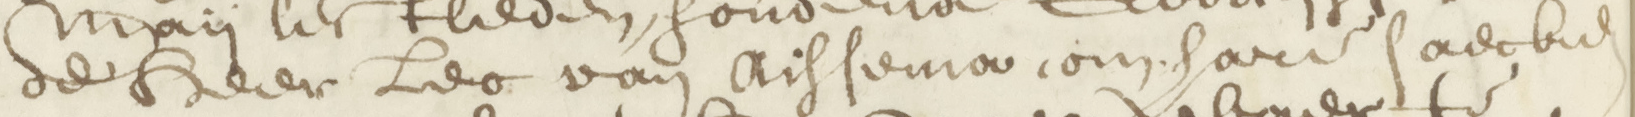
de Heer Leo van Aissema, om hare saecken
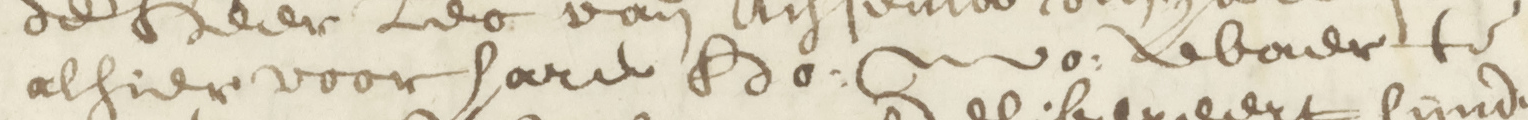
alhier voor hare Ho:Mo: waer te
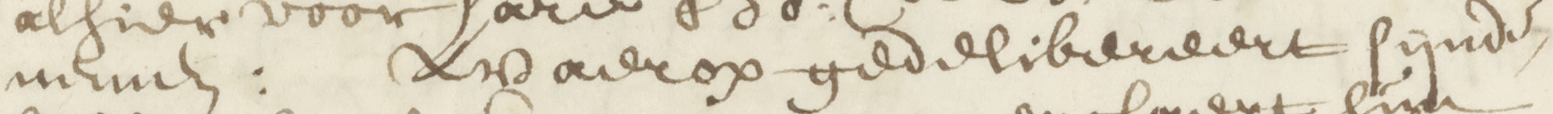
nemen: Waerop gedelibereert sijnde,
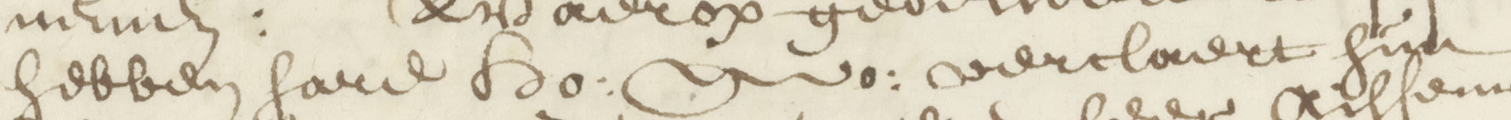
hebben hare Ho:Mo: verclaert hun
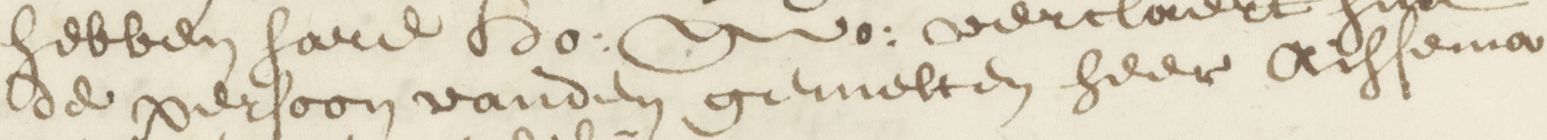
de persoon vanden gemelten heer Aissema
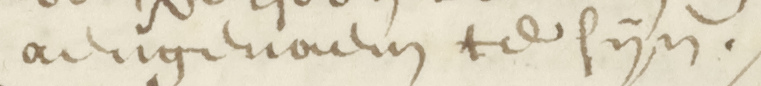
aengenaem te sijn.
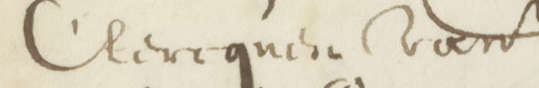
Clercquen van
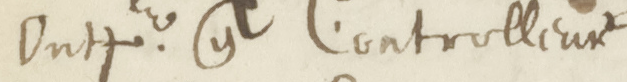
Ontfer. & Controlleur
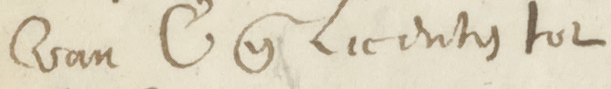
van C & Licenten tot
